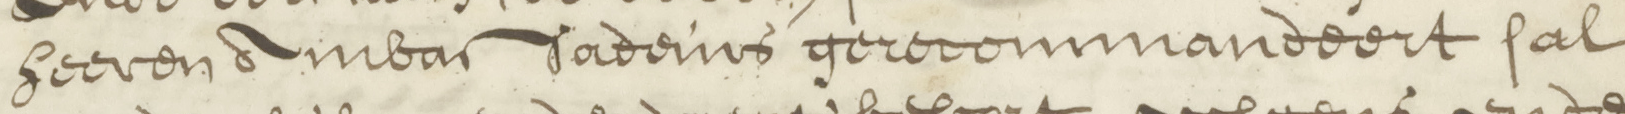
heeren Ambassadeurs gerecommandeert sal
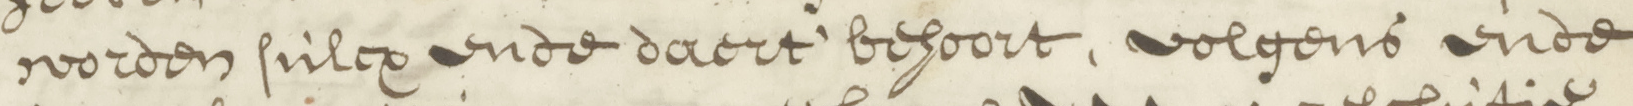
worden sulcx ende daert' behoort, volgens ende
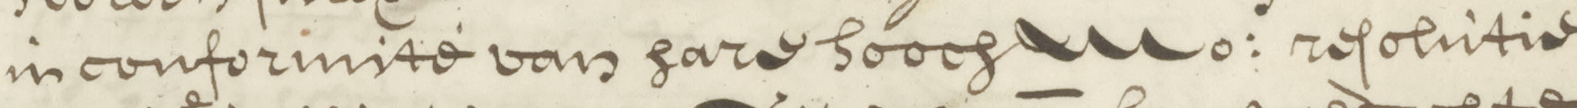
in conformité van hare hoochMo: resolutie
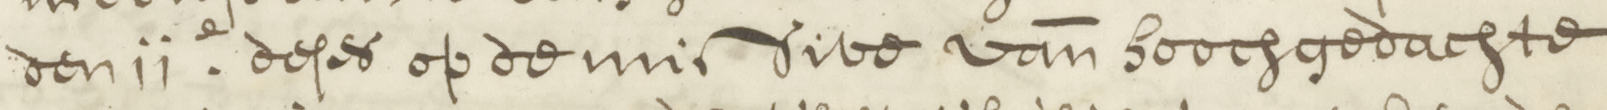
den iie deses op de missive van hoochgedachte
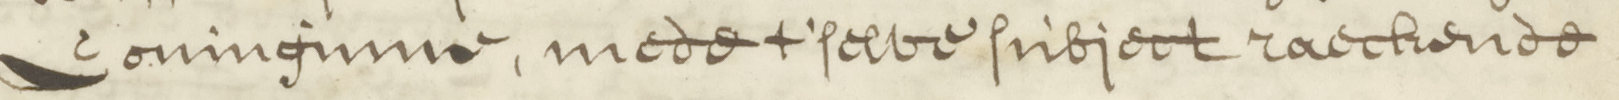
Coninginne, mede t'selve subject raeckende,
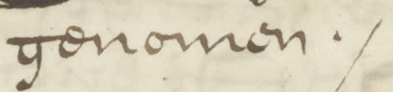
genomen.
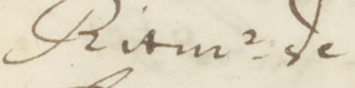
Ritmr. de
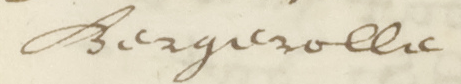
Bergerolle
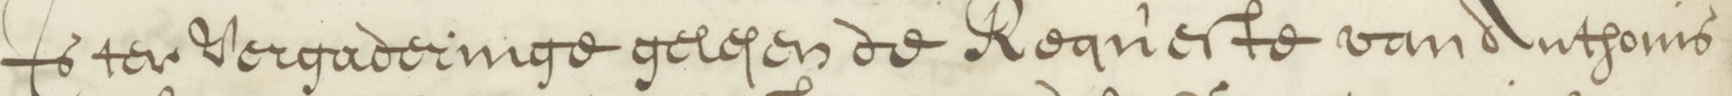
Is ter Vergaderinge gelesen de Requeste van Anthonis
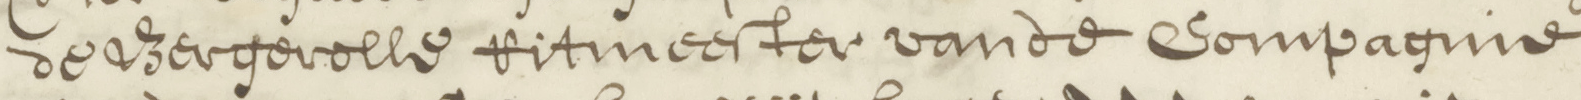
de Bergerolle Ritmeester vande Compagnie
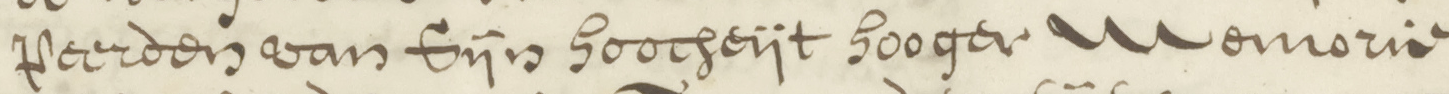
Peerden van Sijn hoocheijt hooger Memorie,
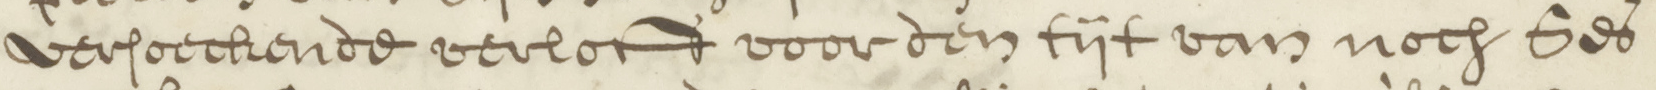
versoeckende verloff voor den tijt van noch Ses
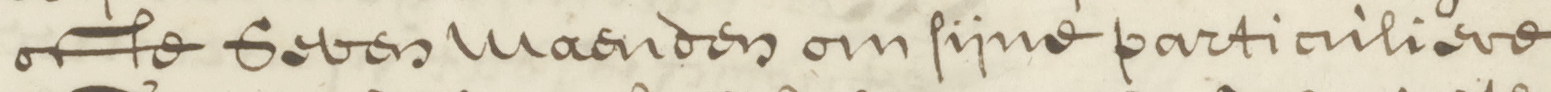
ofte Seven Maenden om sijne particuliere
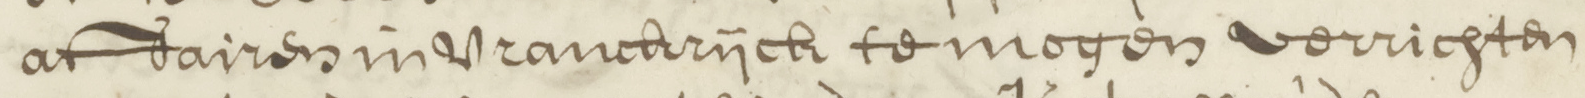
affairen in Vranckrijck te mogen verrichten.
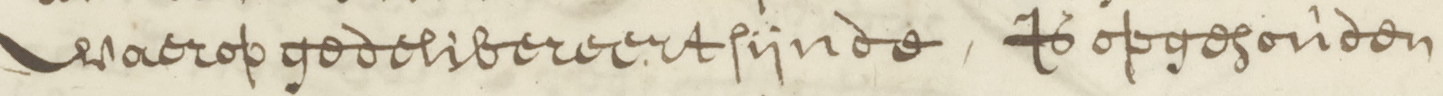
Waerop gedelibereert sijnde, Is opgehouden.
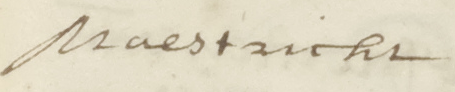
Maestricht
